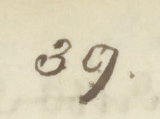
39.
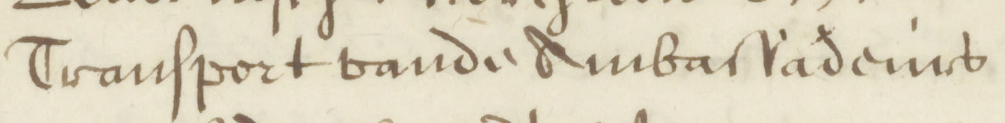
Transport vande Ambassadeurs
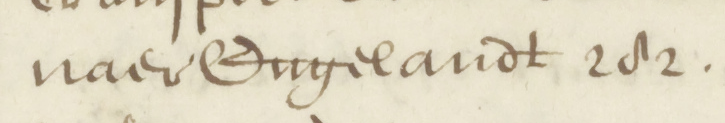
naer Engelandt 282.
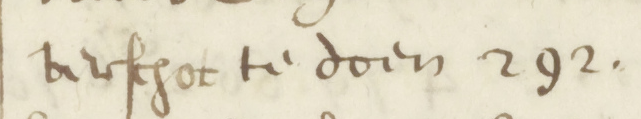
verschot te doen 292.
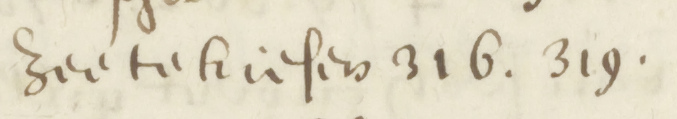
Zee te kiesen 316. 319.
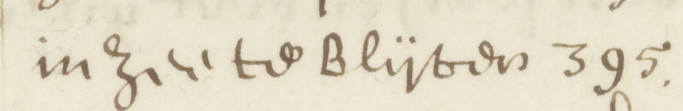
in Zee te blijven 395.
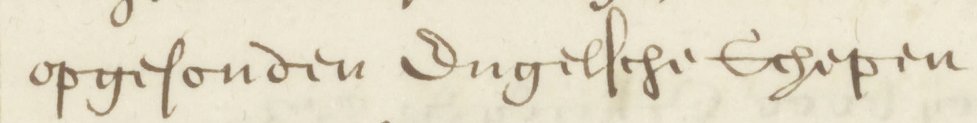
opgesonden Engelsche Schepen
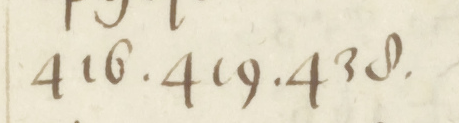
416. 419. 438.
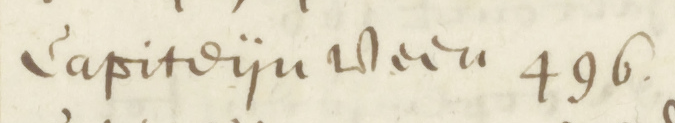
Capiteijn Veen 496.
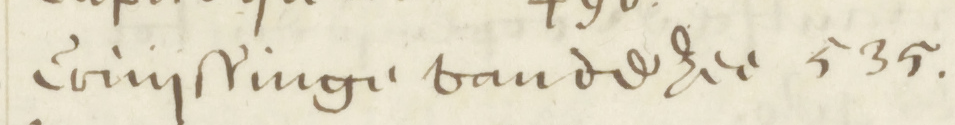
Cruijssinge van de Zee 535.
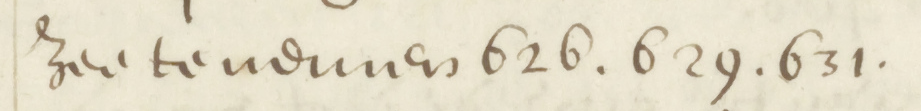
Zee te nemen 626. 629. 631.
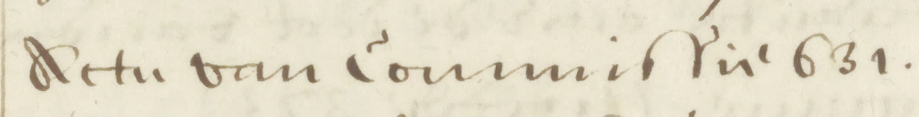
Acte van Commissie 631.
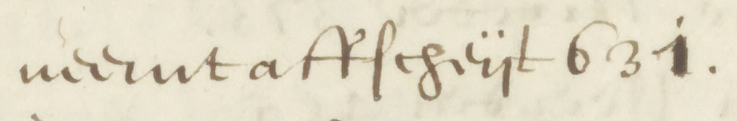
neemt affscheijt 631.
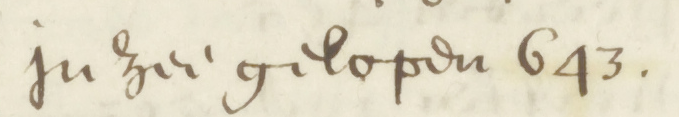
in Zee gelopen 643.
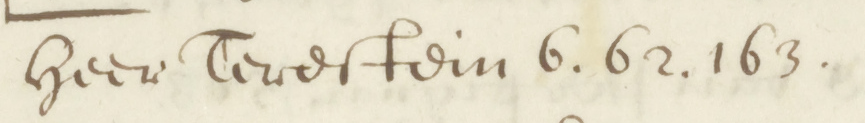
heer Terestein 6. 62. 163.
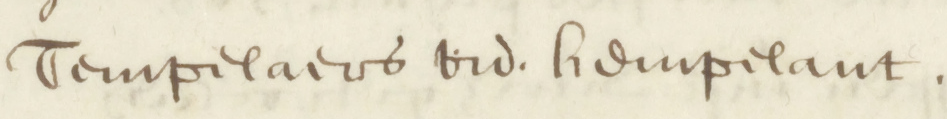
Tempelaers vid. kempelant.
